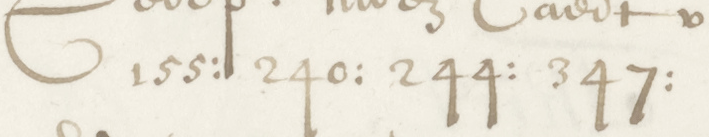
155: 240: 244: 347:
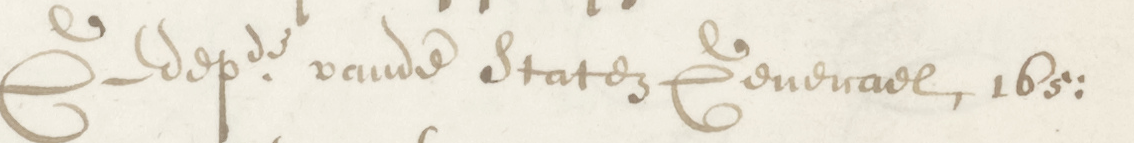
Gedepde. vande Staten Generael, 165:
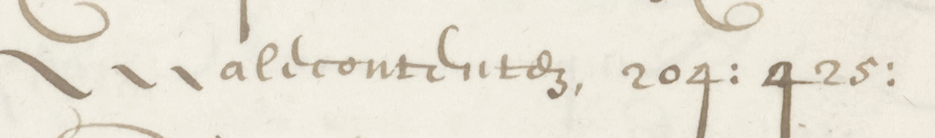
Malecontenten, 204: 425:
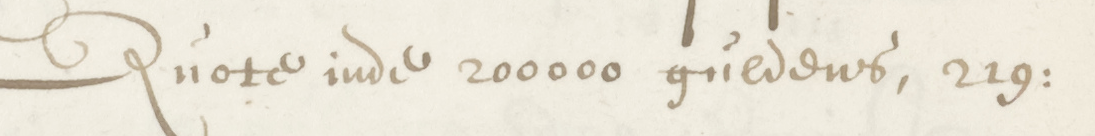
Quote inde 200000 guldens, 219:
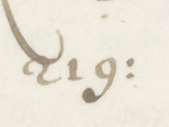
219:
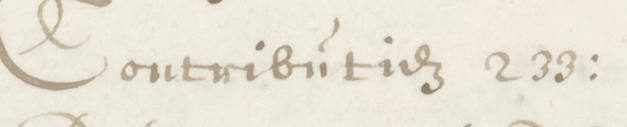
Contributien 233:
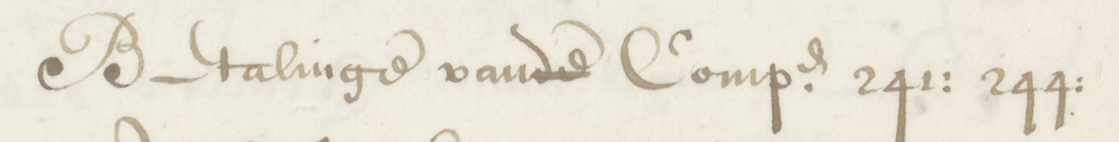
Betalinge vande Compe. 241: 244:
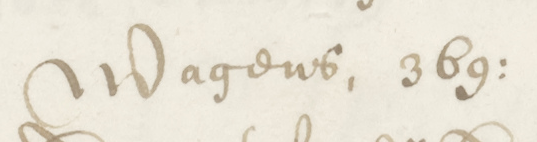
Wagens, 369:
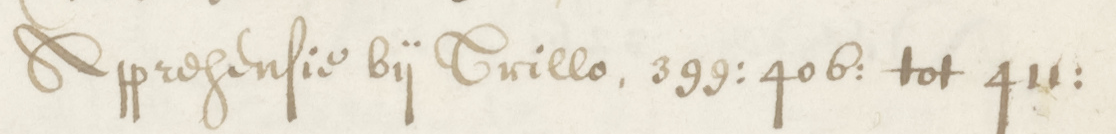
Apprehensie bij Trillo, 399: 406: tot 411:
